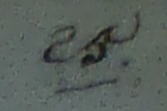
25.
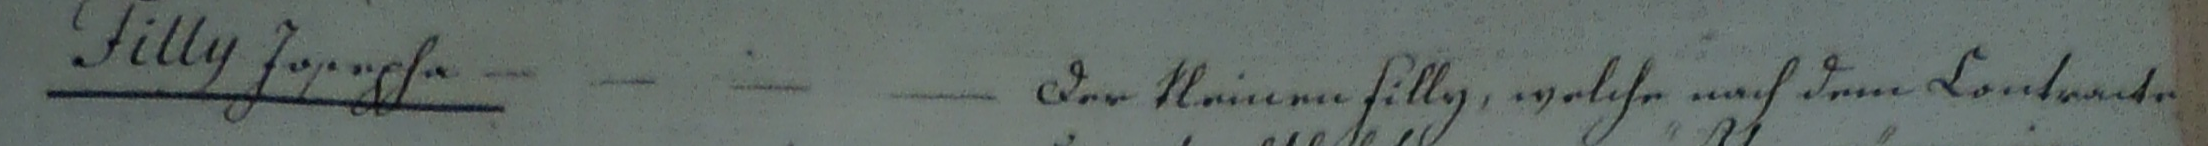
Filly Josepha _ _ _ _ Der kleinen Filly, welche nach dem Contracte
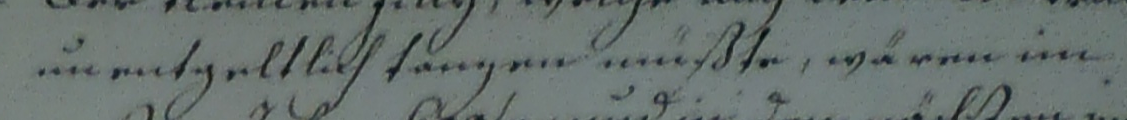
unentgeltlich tanzen müßte, wären im
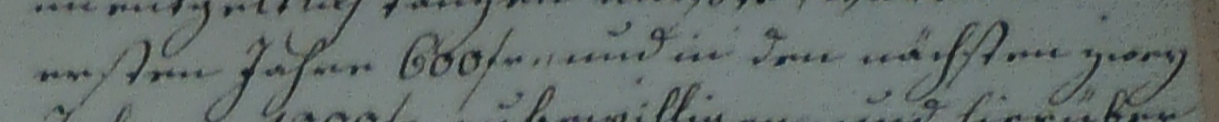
ersten Jahre 600fr., und in den nächsten zwey
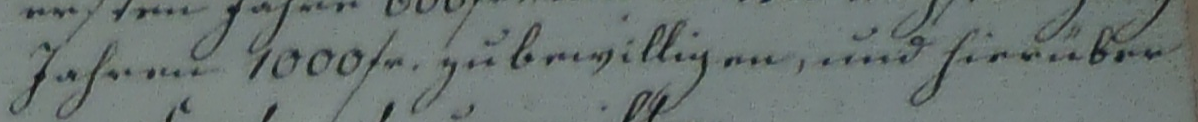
Jahren 1000fr. zubewilligen, und hierüber
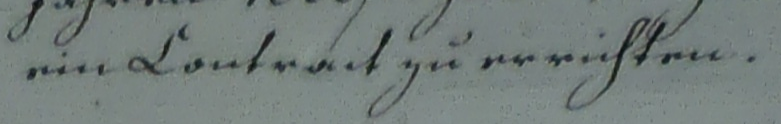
ein Contract zu errichten.
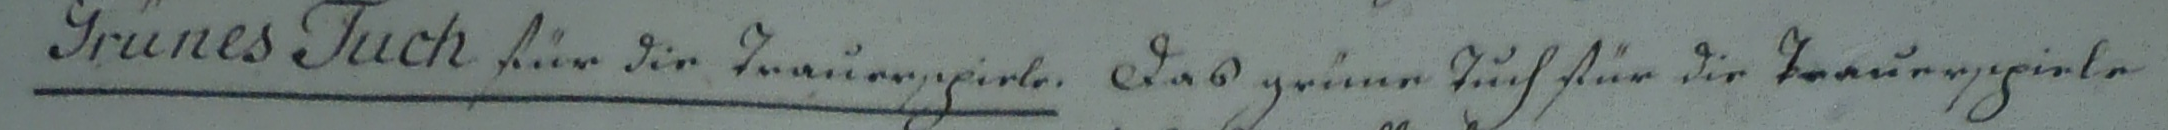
Grünes Tuch für die Trauerspiele. Das grüne Tuch für die Trauerspiele
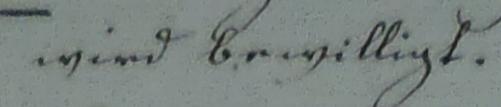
wird bewilligt.
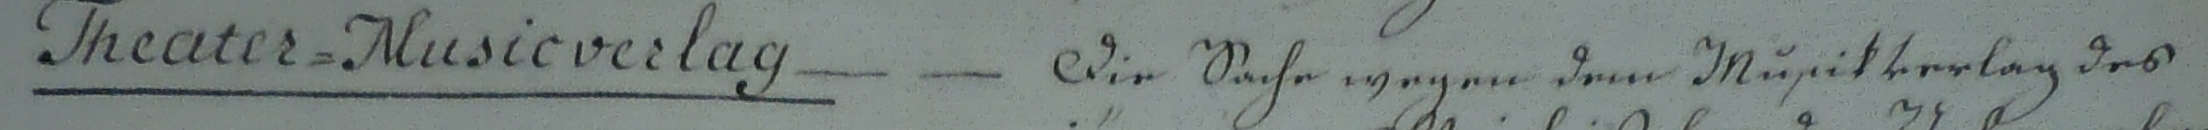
Theater‗Musicverlag _ _ Die Sache wegen dem Musicverlag des
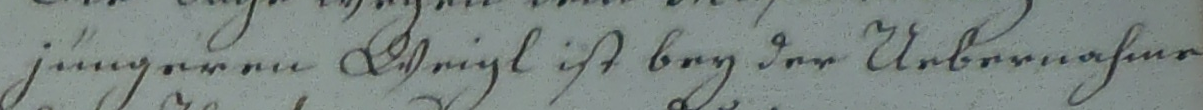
jüngeren Weigl ist bey der Uebernahme
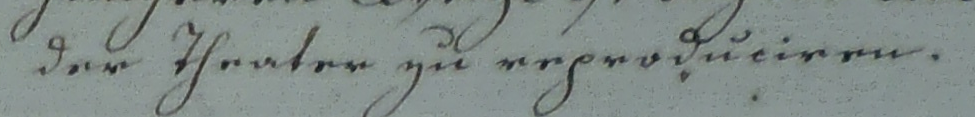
der Theater zu reproduciren.
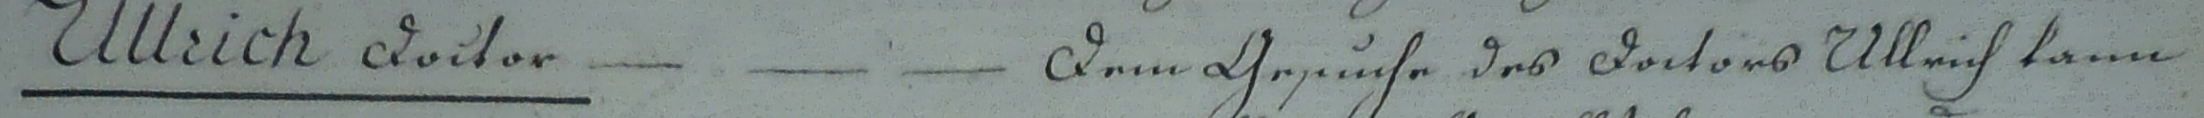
Ullrich Doctor _ _ _ Dem Gesuche des Doctors Ullrich kann
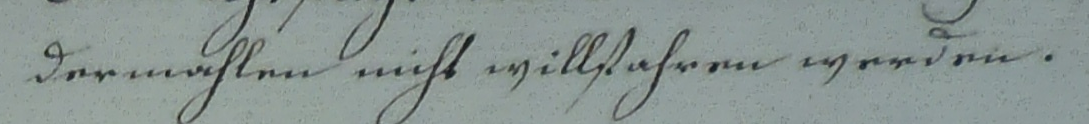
dermahlen nicht willfahren werden.
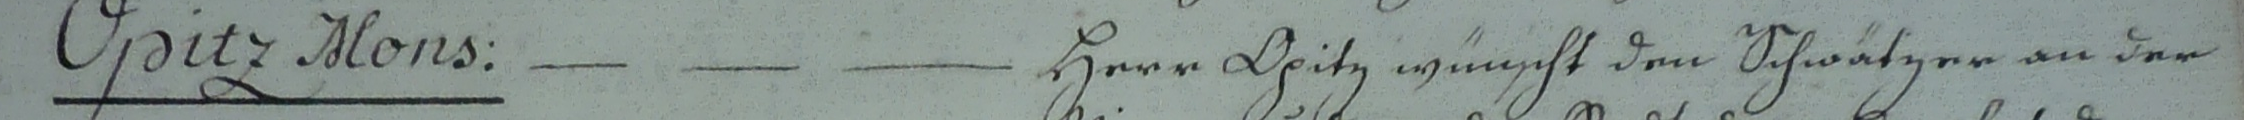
Opitz Mons: _ _ _ Herr Opitz wünscht den Schwätzer an der
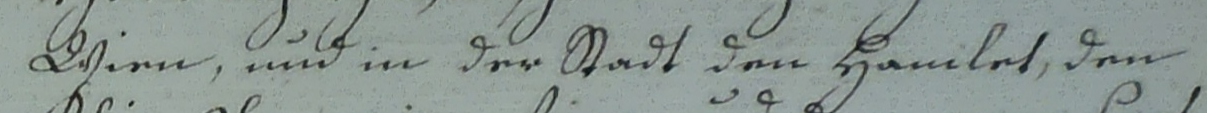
Wien, und in der Stadt den Hamlet, den
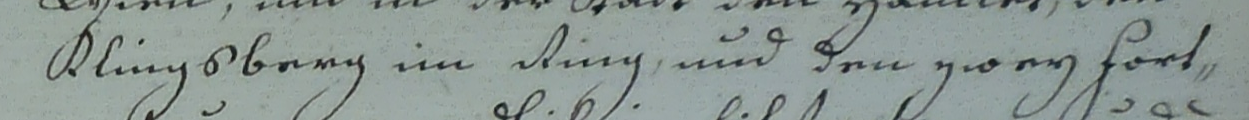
Klingsberg im Ring, und den zwey Fort¬
